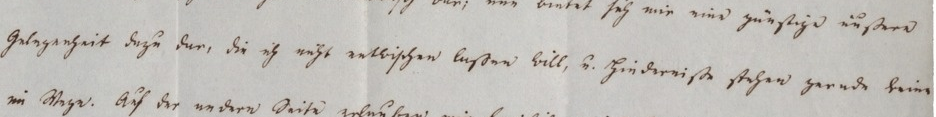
Gelegenheit dazu dar, die ich nicht entwischen lassen will, u. Hinderniße stehen gerade keine
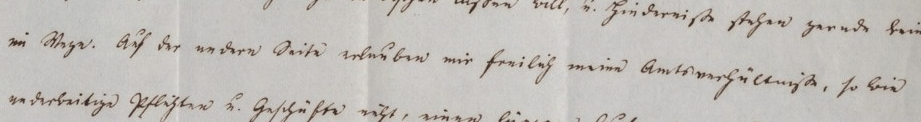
im Wege. Auf der andern Seite erlauben mir freilich meine Amtsverhältnisse, so wie
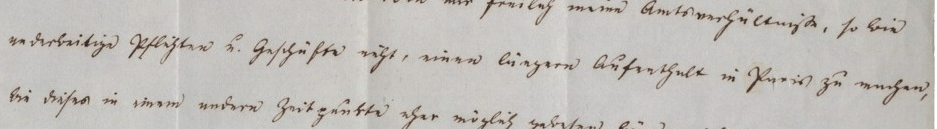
anderweitige Pflichten u. Geschäfte nicht, einen längern Aufenthalt in Paris zu machen,
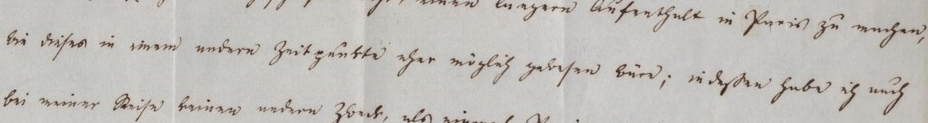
wie dieses in einem andern Zeitpunkte eher möglich gewesen wäre; indessen habe ich auch
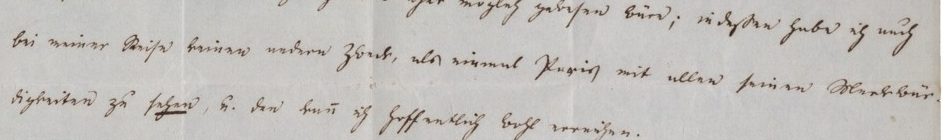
bei meiner Reise keinen andern Zweck, als einmal Paris mit allen seinen Merkwür-
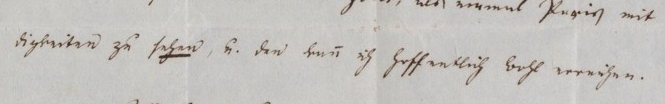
digkeiten zu sehen, u. den kann ich hoffentlich wohl erreichen.
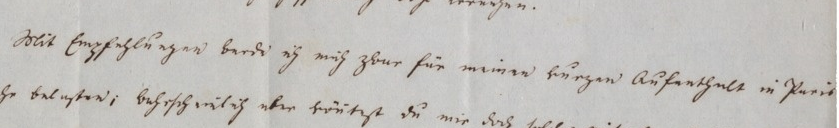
Mit Empfehlungen werde ich mich zwar für meinen kurzen Aufenthalt in Paris
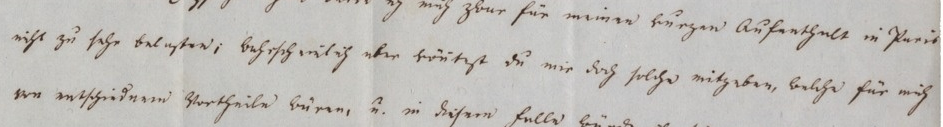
nicht zu sehr belasten; wahrscheinlich aber könntest du mir doch solche mitgeben, welche für mich
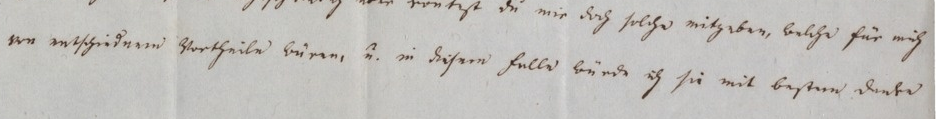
von entschiednem Vortheile wären, u. in diesem Falle würde ich sie mit bestem Danke
